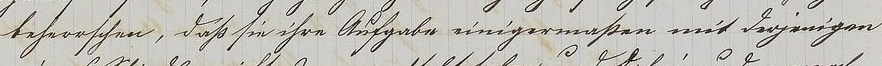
beherrschen, daß sie ihre Aufgabe einigermaßen mit derjenigen
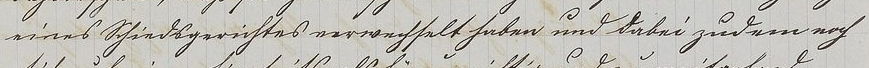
eines Schiedsgerichtes verwechselt haben und dabei zudem noch
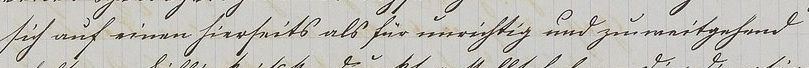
sich auf einen hierseits als für unrichtig und zuweitgehend
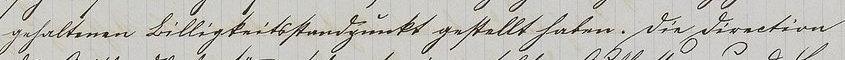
gehaltenen Billigkeitsstandpunkt gestellt haben. Die Direction
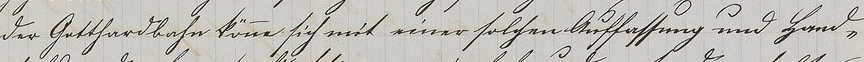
der Gotthardbahn könne sich mit einer solchen Auffassung und Hand-
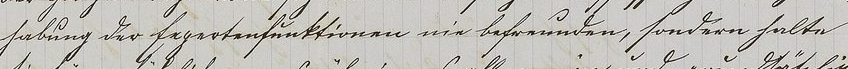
habung der Expertenfunktionen nie befreunden, sondern halte
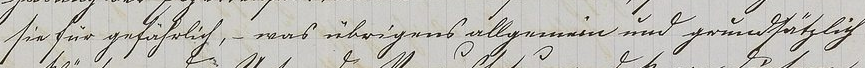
sie für gefährlich, – was übrigens allgemein und grundsätzlich
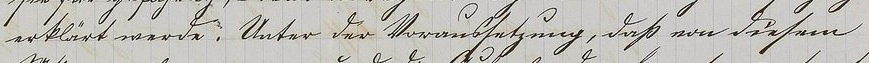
erklärt werde. Unter der Voraussetzung, daß von diesem
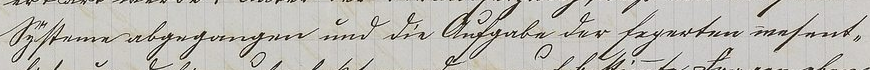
Systeme abgegangen und die Aufgabe der Experten wesent-
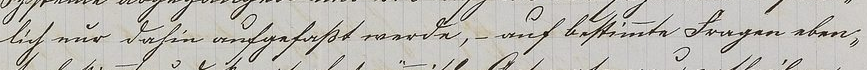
lich nur dahin aufgefaßt werde, – auf bestimmte Fragen eben-
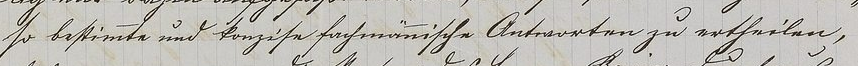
so bestimmte und konzise fachmännische Antworten zu ertheilen,
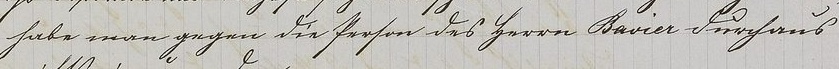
habe man gegen die Person des Herrn Bavier durchaus
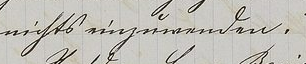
nichts einzuwenden.
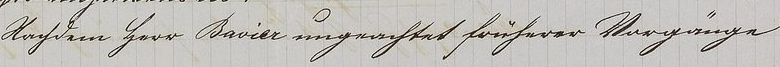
Nachdem Herr Bavier ungeachtet früherer Vorgänge
